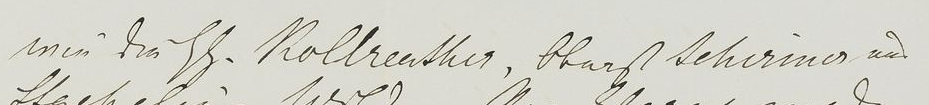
wie die HH. Köllreuther, Oberst Schirmer und
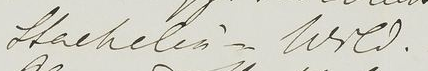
Staehelin-Wild. –
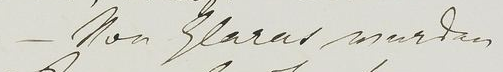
Von Glarus werden
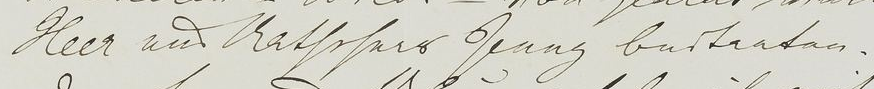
Heer und Rathsherr Jenny beitreten.
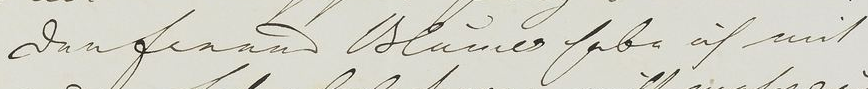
Den Freund Blumer habe ich mit
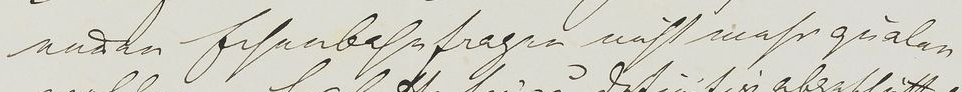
neuen Eisenbahnfragen nicht mehr quälen
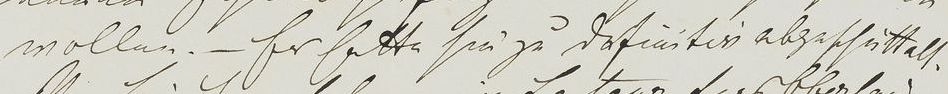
wollen. – Er hatte sie zu definitiv abgeschüttelt.
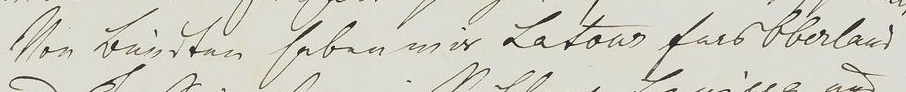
Von Bündten haben wir Latour fürs Oberland
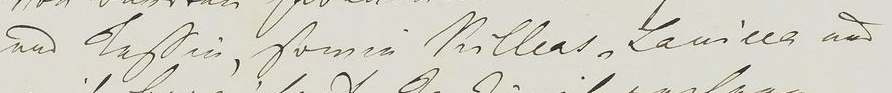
und Tessin, sowie Killias, Lanicca und
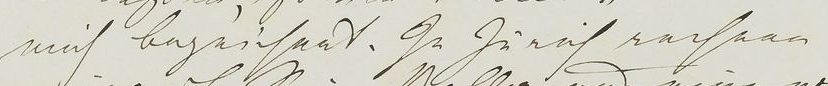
mich bezeichnet. In Zürich rechnen
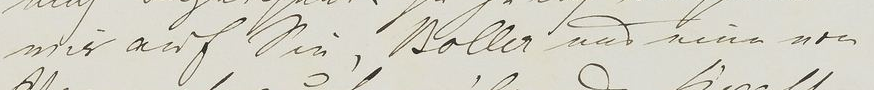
wir auf Sie, Boller und eine von
